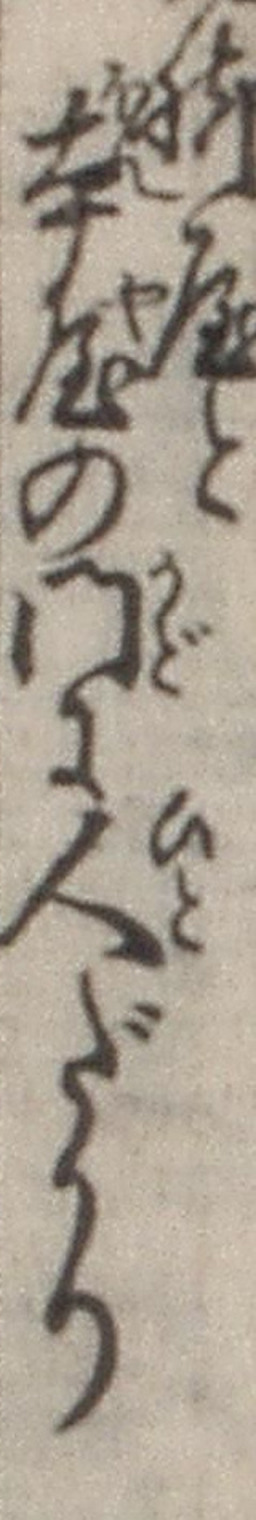本屋の門に人だかり
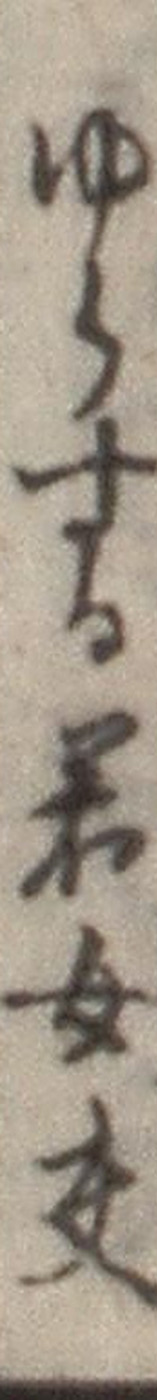ゆらする若女夫
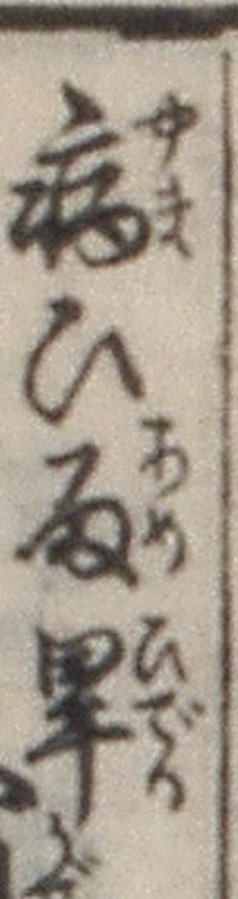病ひ雨旱
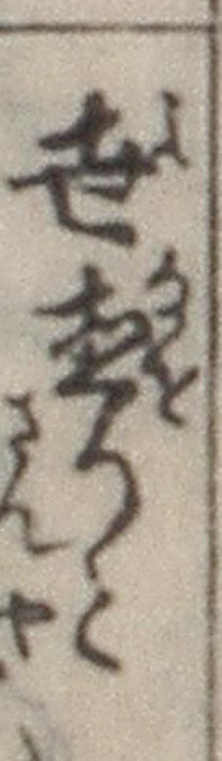世直りと
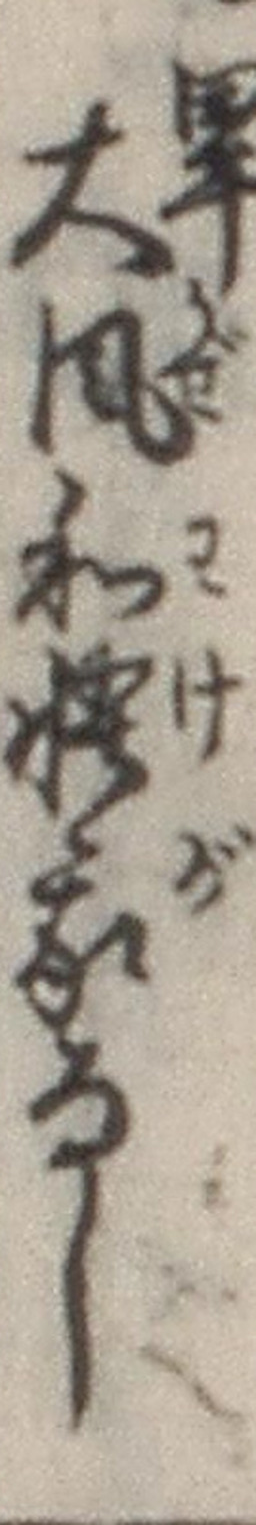大風和怪我なし
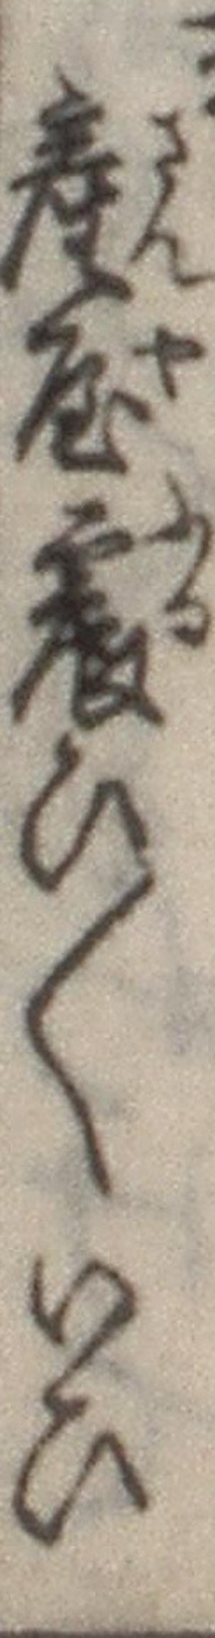産屋震ひ〳〵いひ
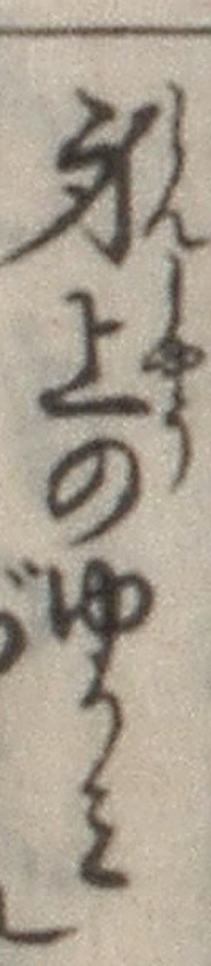身上のゆかみ
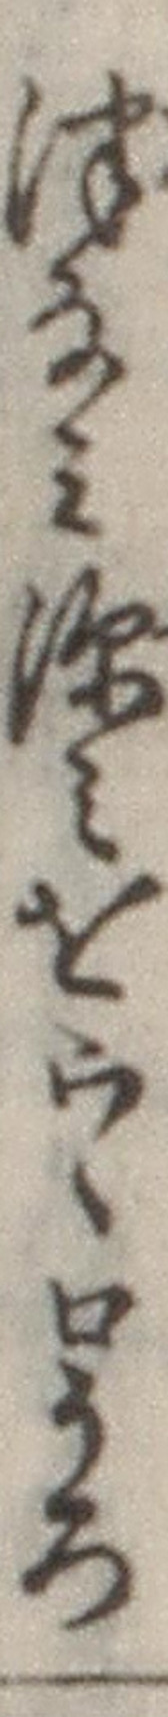津なみ深みをウヽロうろ
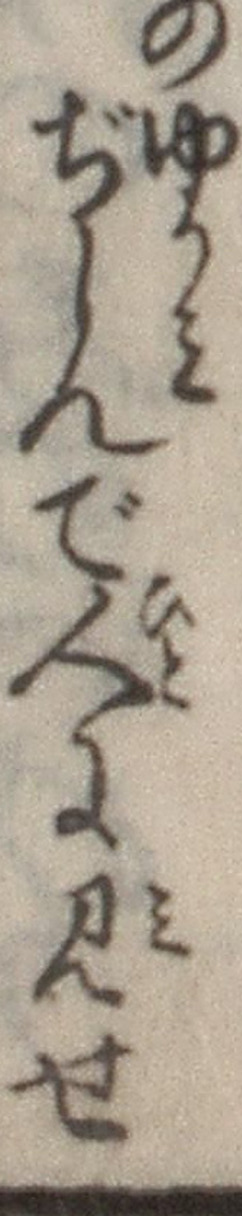ぢしんで人に見せ
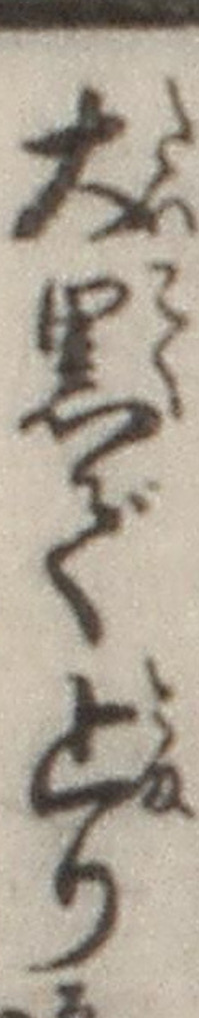大黒で止り
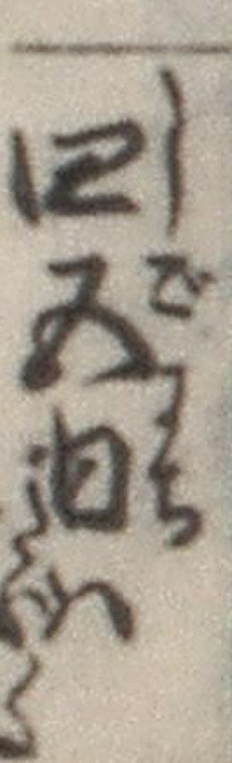四五日は
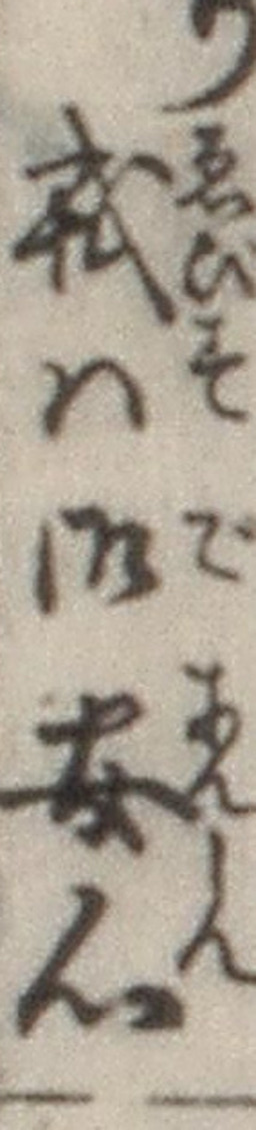戎は御安心
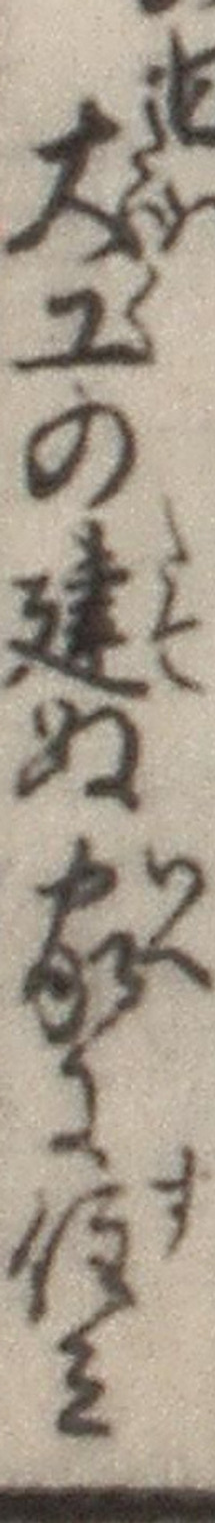大工の建ぬ家に住み
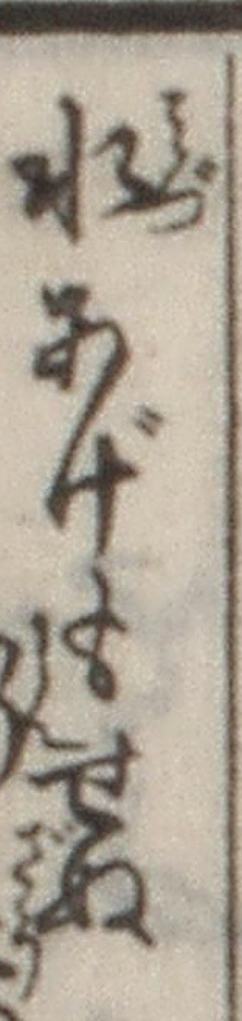水あげもせぬ
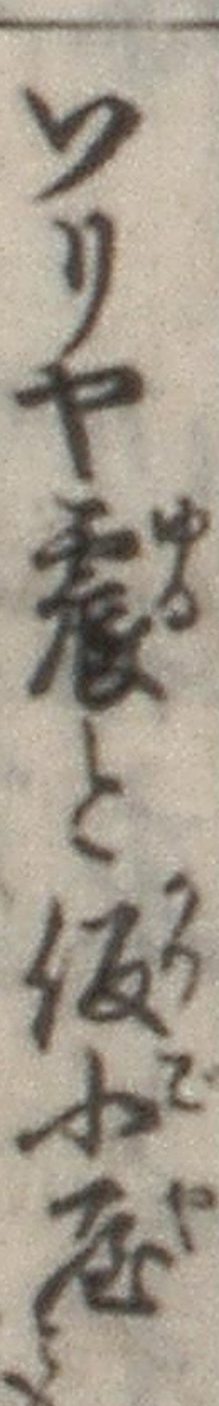ソリヤ震と仮小屋
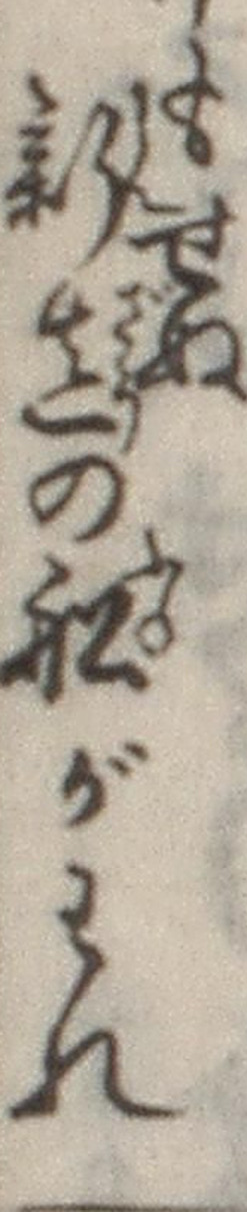新造の舩がわれ
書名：諸國大地震年代記　末代噺種
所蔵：東京大学地震研究所図書室 Earthquake Research Institute Library, The University of Tokyo, JAPAN
